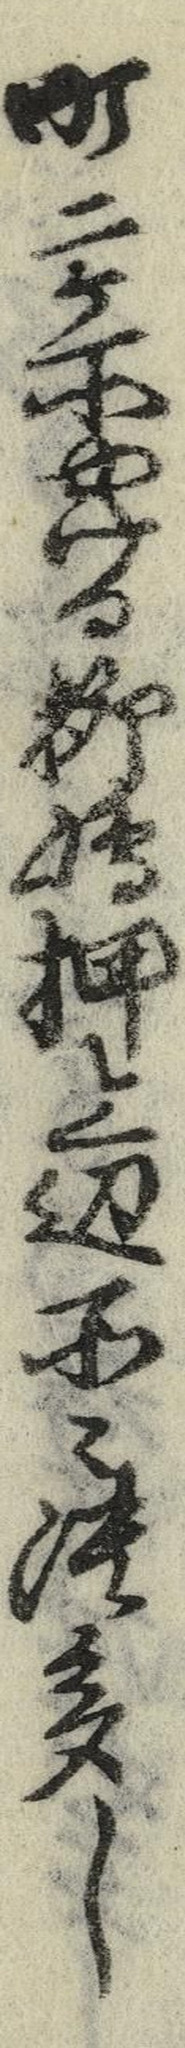町二ケ所やける柳嶋押上辺所々潰多し
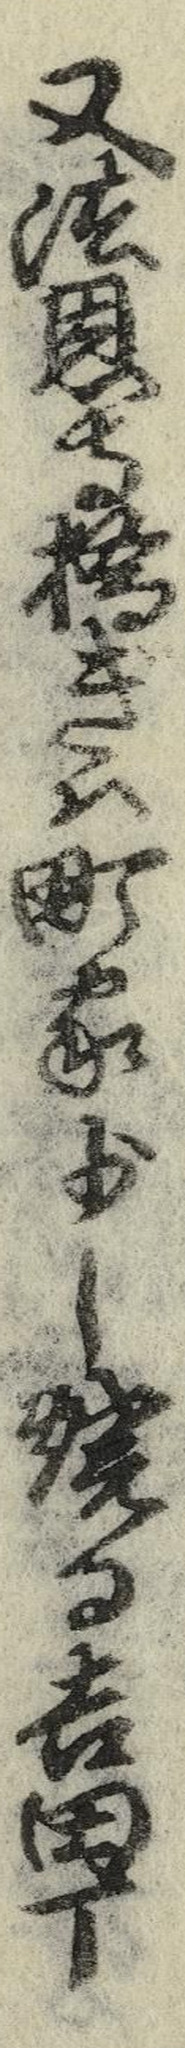又法恩寺橋きは町家少し焼る吉田丁
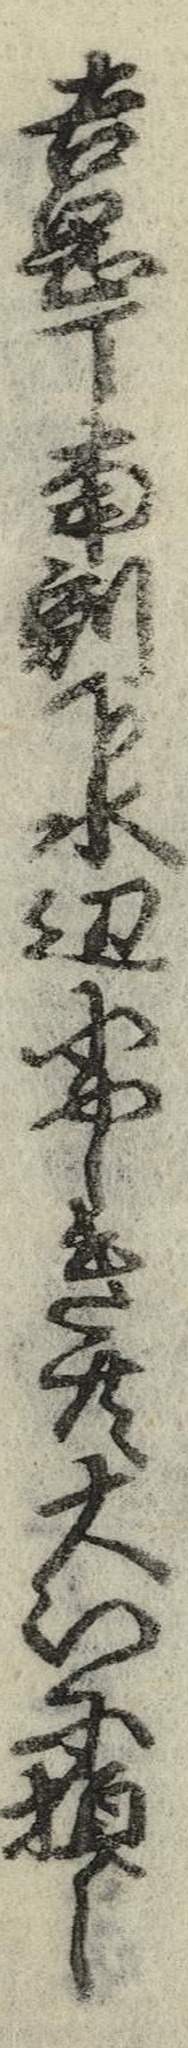吉岡丁南割下水辺小やしき共大いに損し
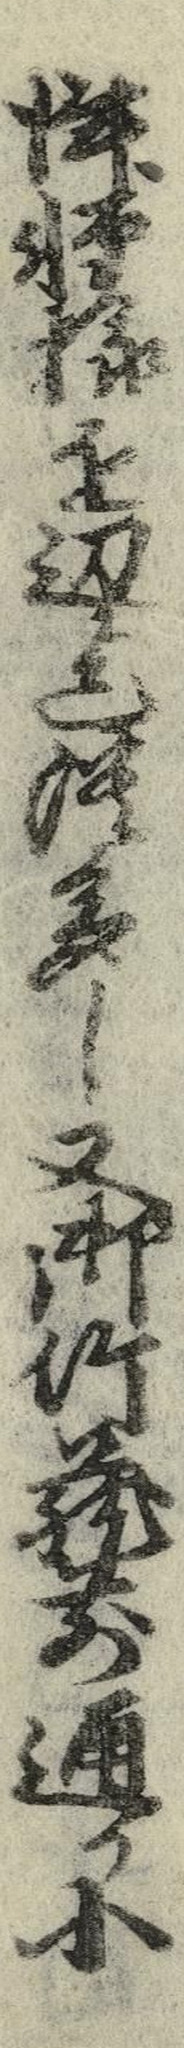津軽様近辺まで潰多し又御竹蔵前通り小
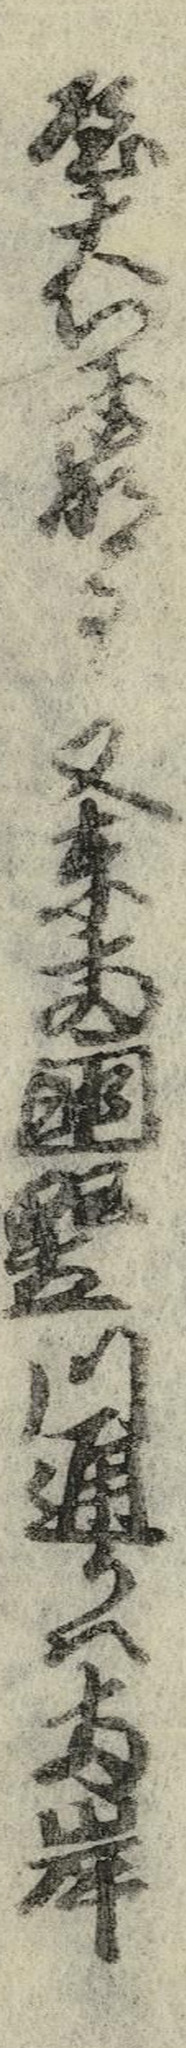屋大いに崩る又東両国竪川通りは両岸
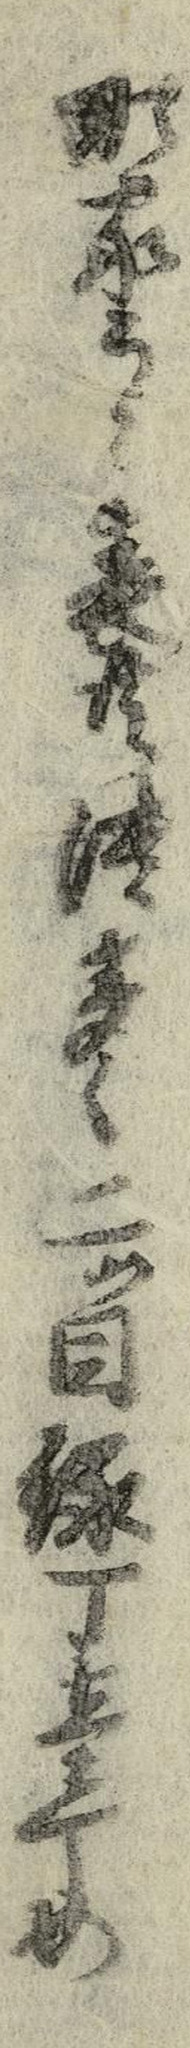町家うら表共潰多く二目緑丁壱丁め

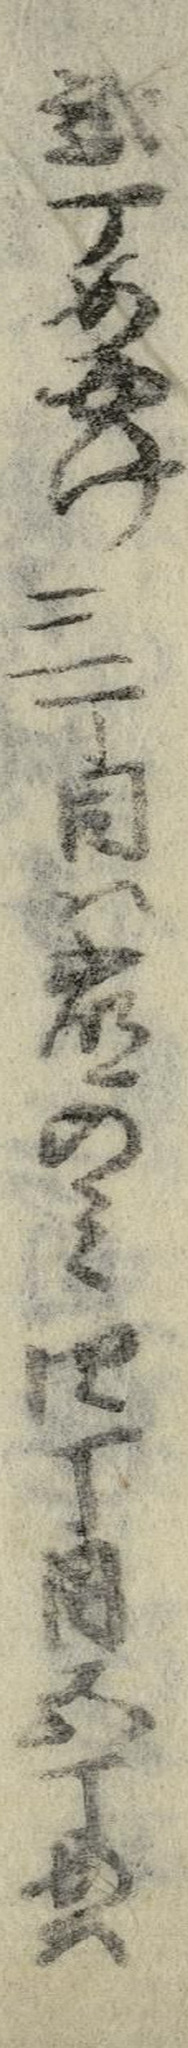弐丁めやけ三丁目は崩のみ四丁目五丁めは
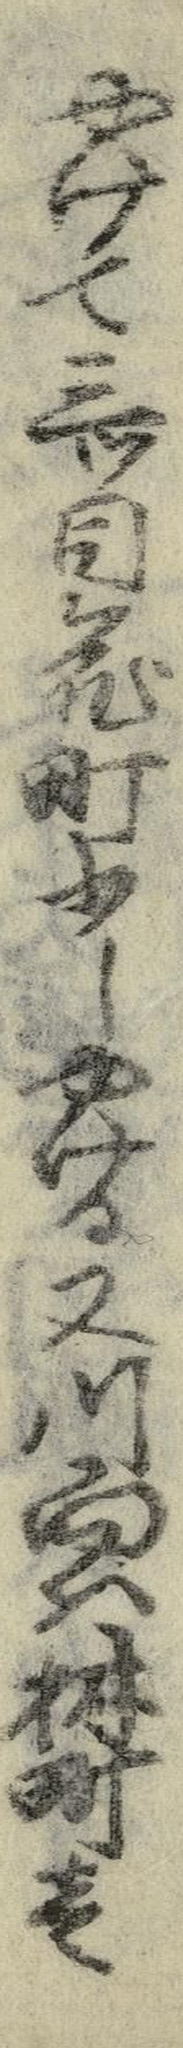やけて三つ目蔵町少しやける又川向は林町壱
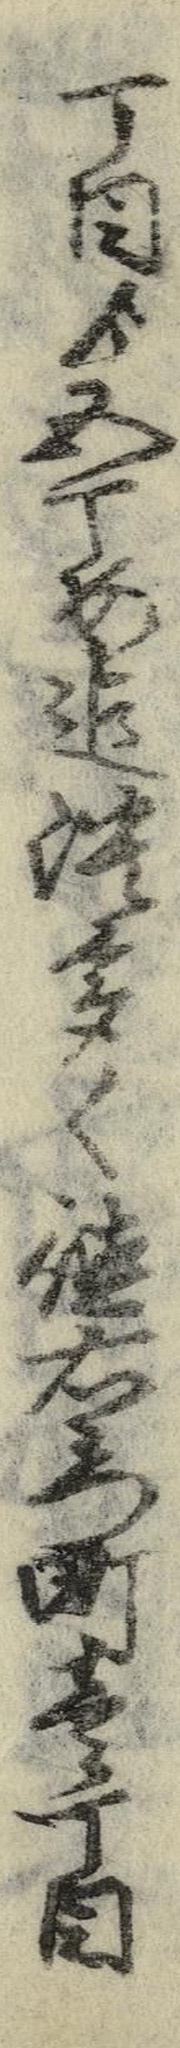丁目ゟ五丁め迄潰多く徳右衛門町壱丁目
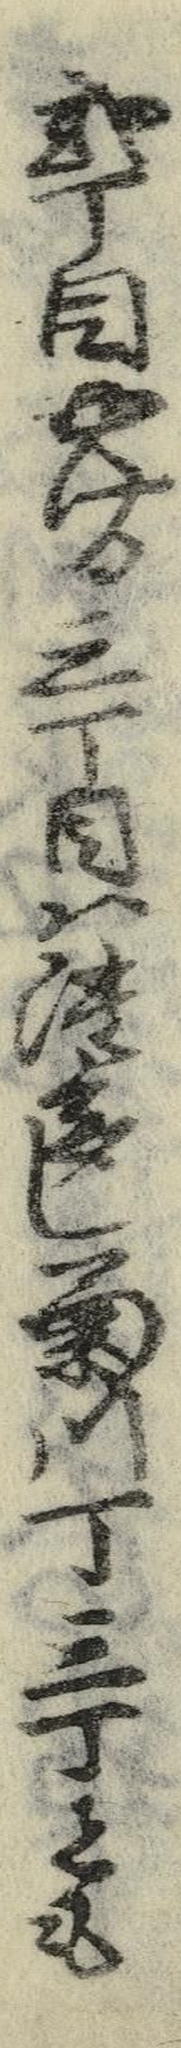弐丁目やける三丁目は潰多し菊川丁三丁とも
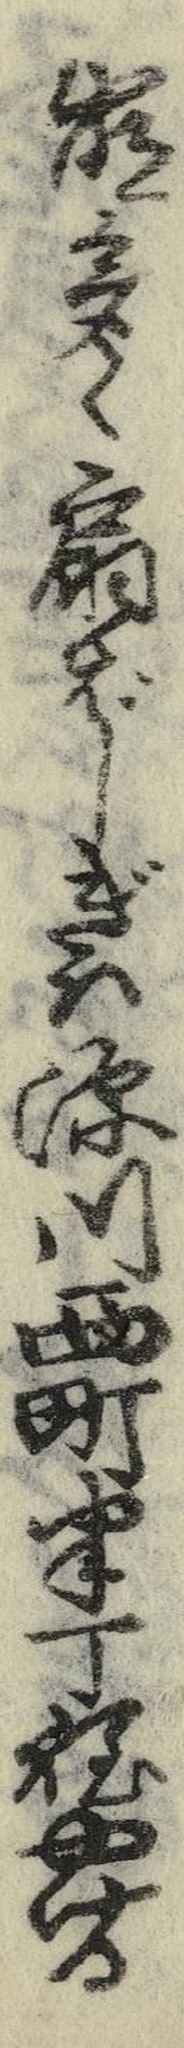崩多く扇ばしぎは深川西町半丁程やける
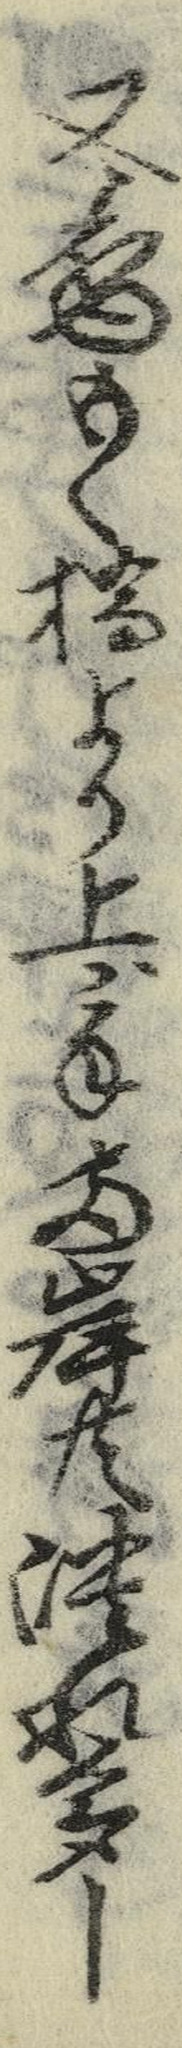又しゆもく橋より上ハ手両岸共潰れ多し
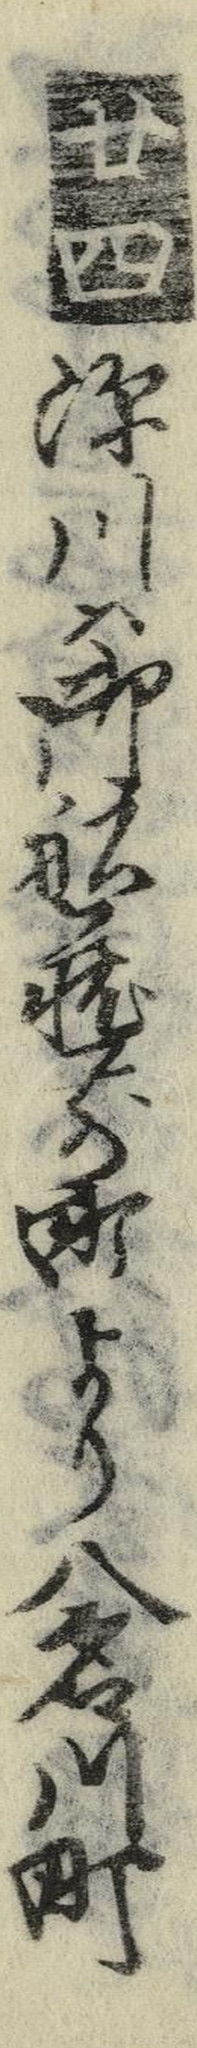廿四深川は御船蔵前町より八名川町
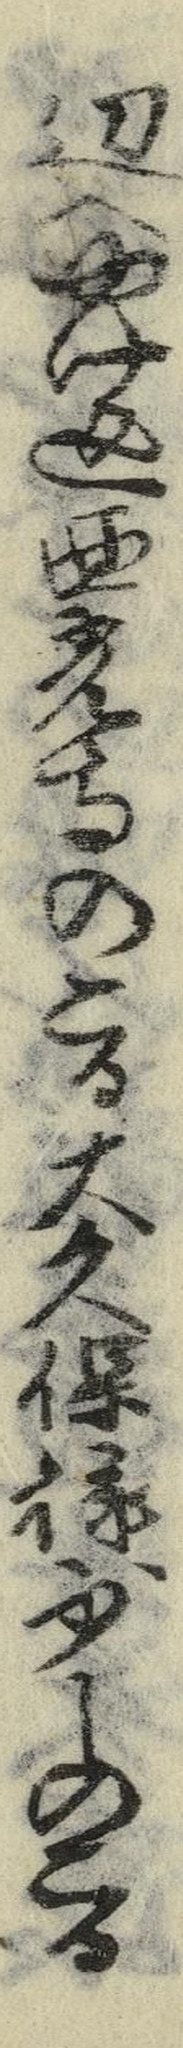辺へやけ込西光寺のこる大久保様少しのこる
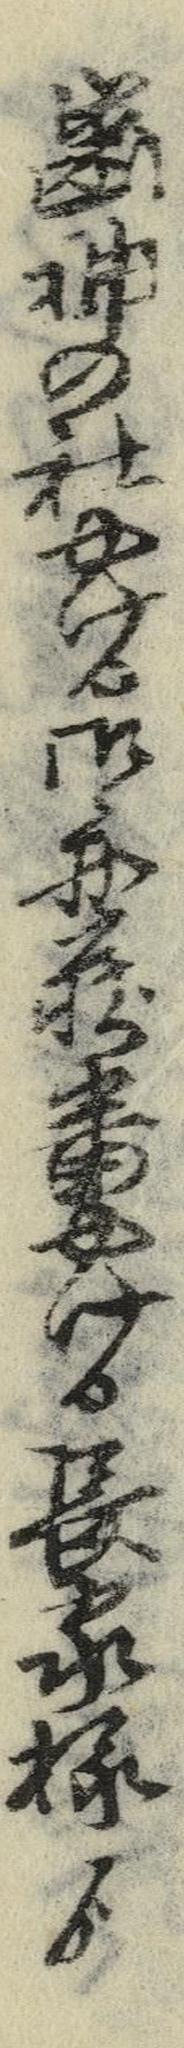歳神の社やける御舟蔵番やける長州様ゟ
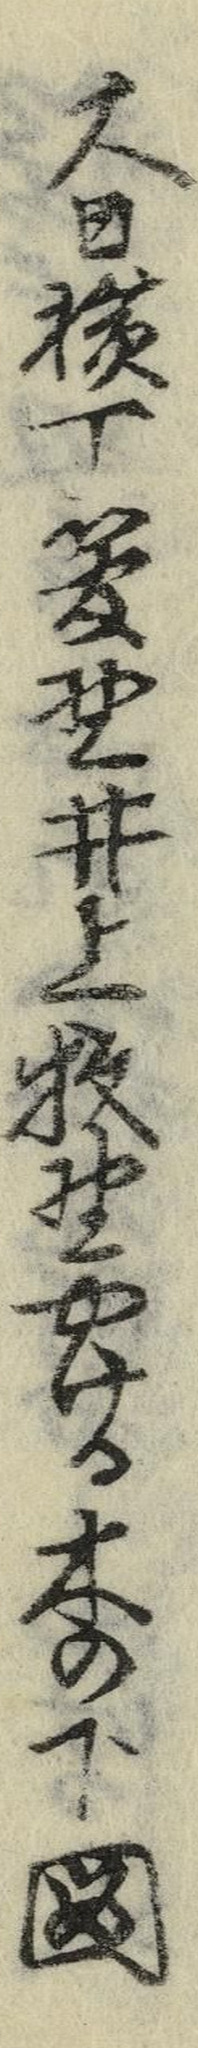大日横丁管野井上牧野やける木の下図
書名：地震類焼場所明細書之写　安政二卯年十月二日夜四ツ時過　御府内御屋敷方市中共、并街道筋近郷聞書
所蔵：東京大学地震研究所図書室 Earthquake Research Institute Library, The University of Tokyo, JAPAN
